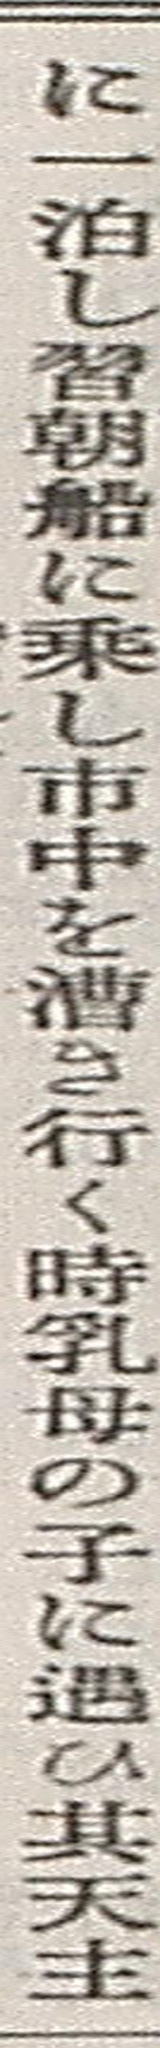に一泊し翌朝船に乗し市中を漕き行く時乳母の子に遇ひ其天主
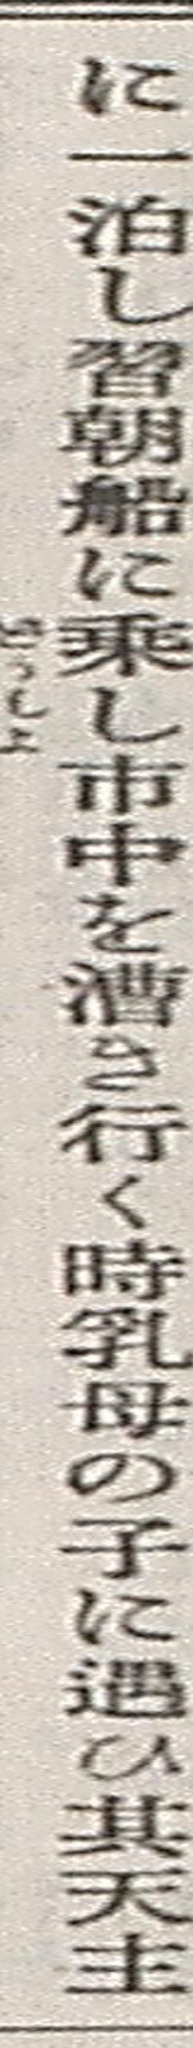に一泊し翌朝船に乗し市中を漕き行く時乳母の子に遇ひ其天主
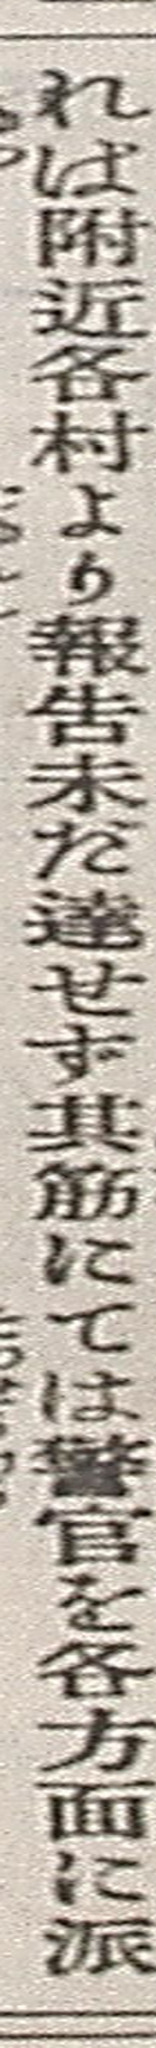れば附近各村より報告未だ達せず其筋にては警官を各方面に派
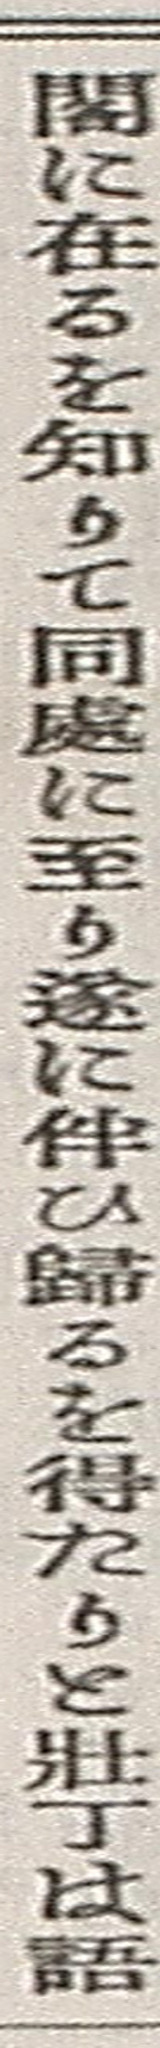閣に在るを知りて同処に至り遂に伴ひ帰るを得たりと壮丁は語
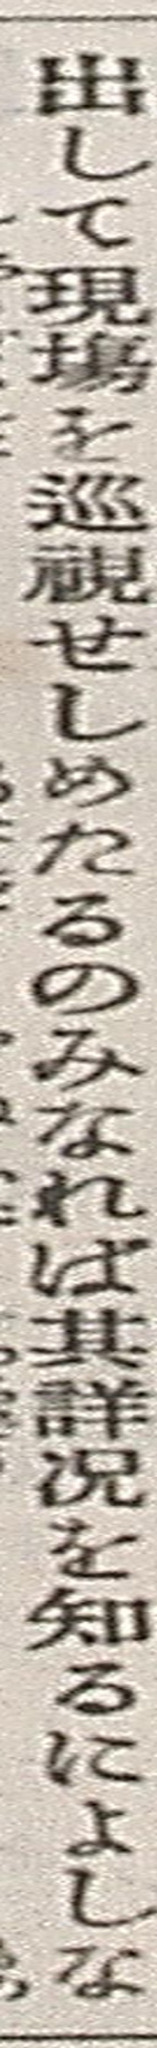出して現場を巡視せしめたるのみなれば其詳况を知るによしな
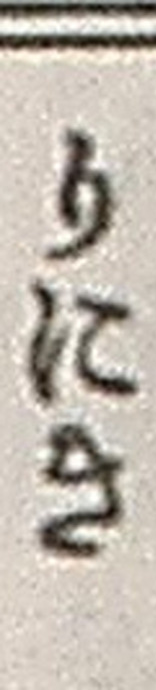りにき
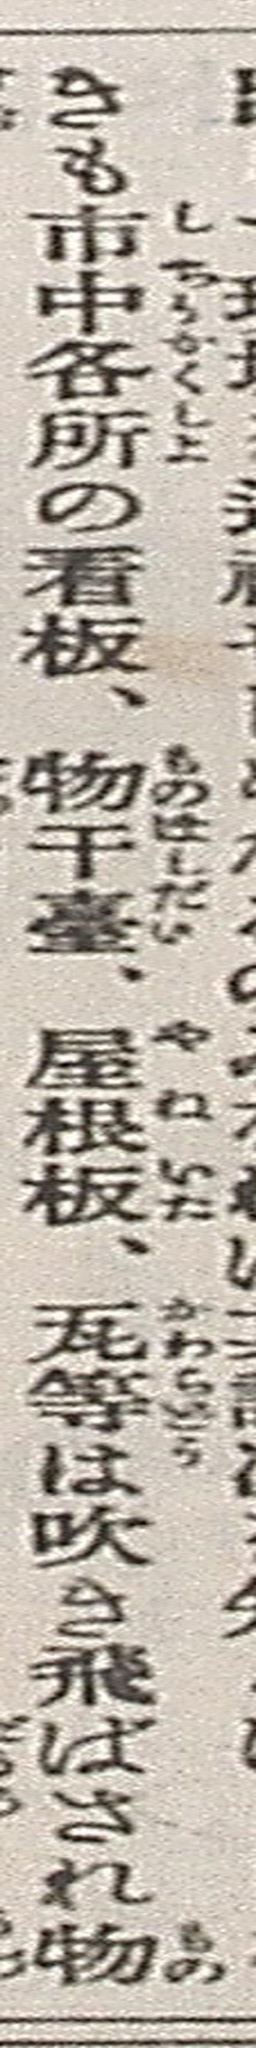きも市中各所の看板、物干台、家根板、瓦等は吹き飛ばされ物
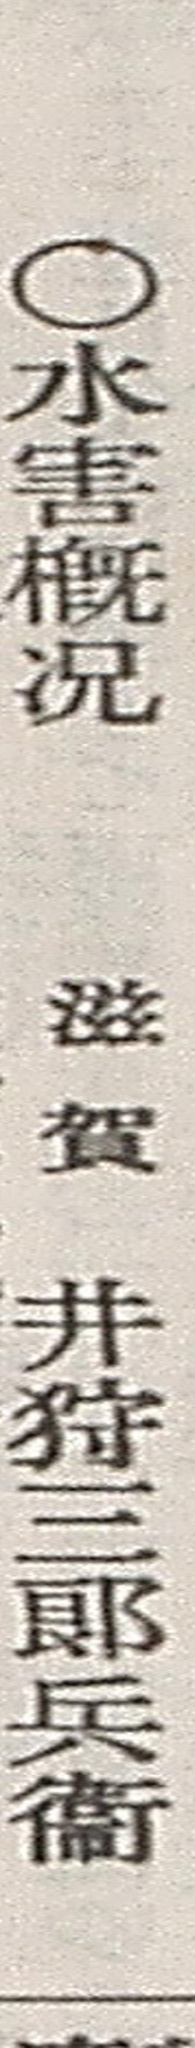◯水害概況滋賀井狩三郎兵衛
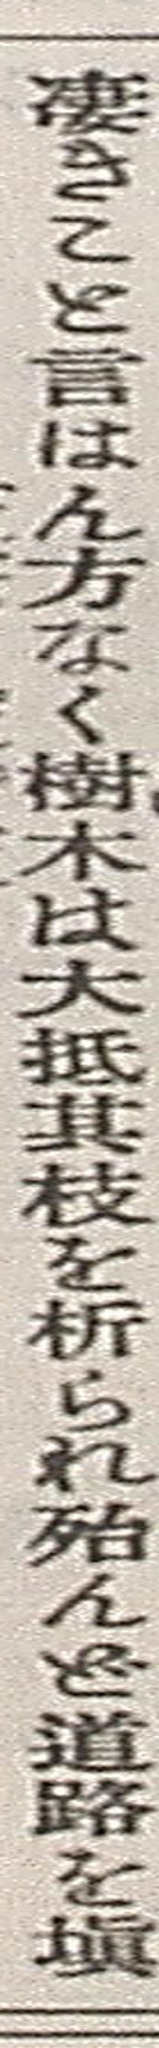凄きこと言はん方なく樹木は大低其枝を折られ殆んど道路を塡
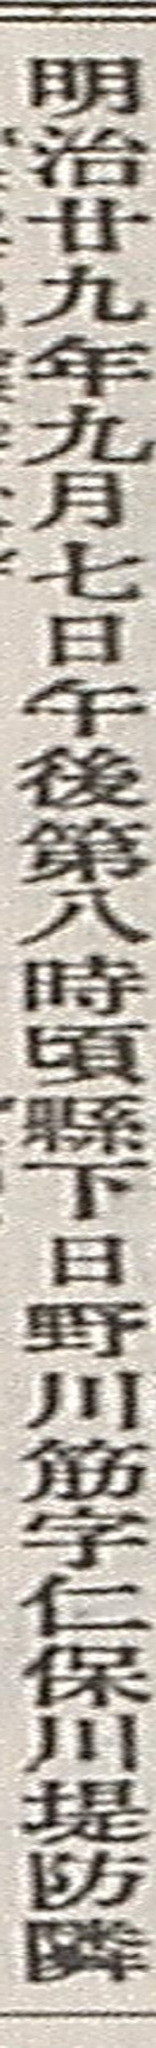明治廿九年九月七日午後第八時頃縣下日野川筋字仁保川堤防隣
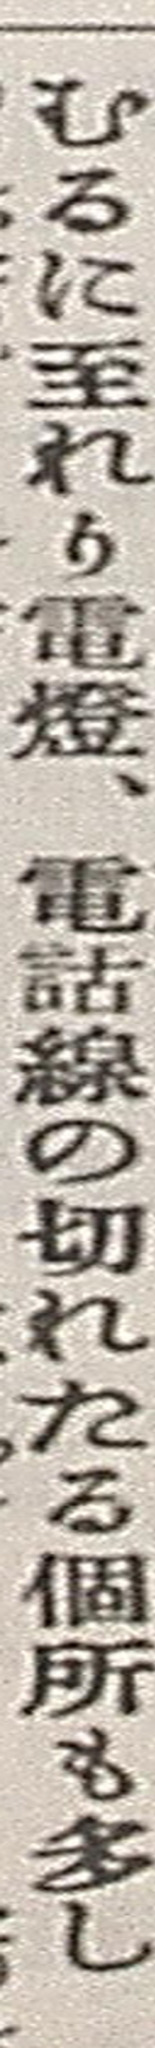むるに至れり電燈、電話線の切れたる個所も多し
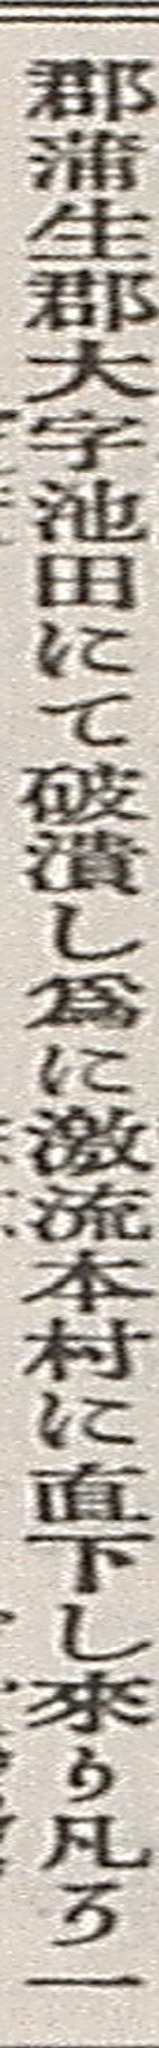郡蒲生郡大字池田にて破潰し為に激流本村に直下し来り凡そ一
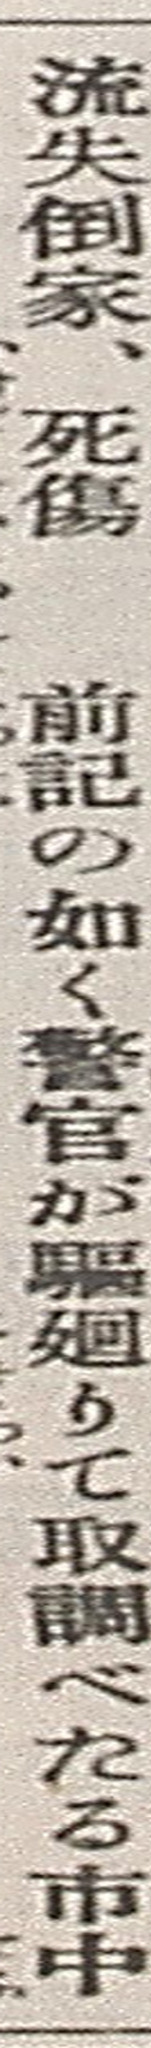流失倒家、死傷前記の如く警官が驅廻りて取調べたる市中
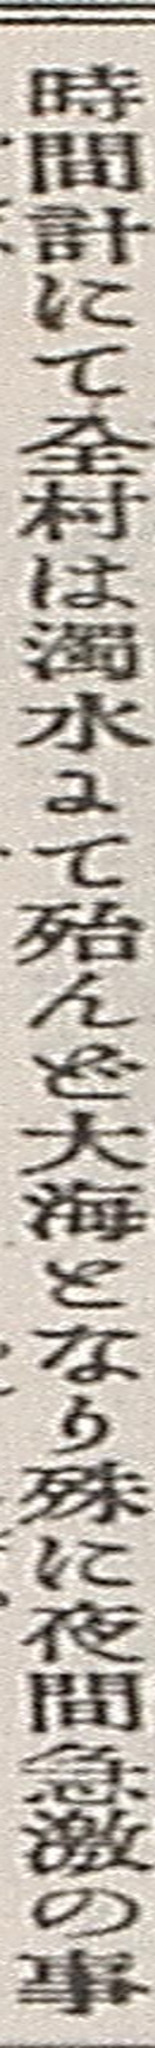時間計にて全村は濁水にて殆んど大海となり殊に夜間急激の事
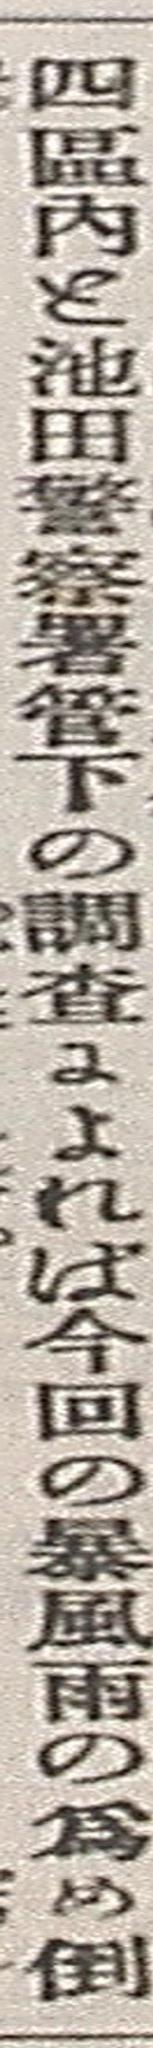四區内と池田警察署管下の調査によれば今回の暴風雨の為め倒
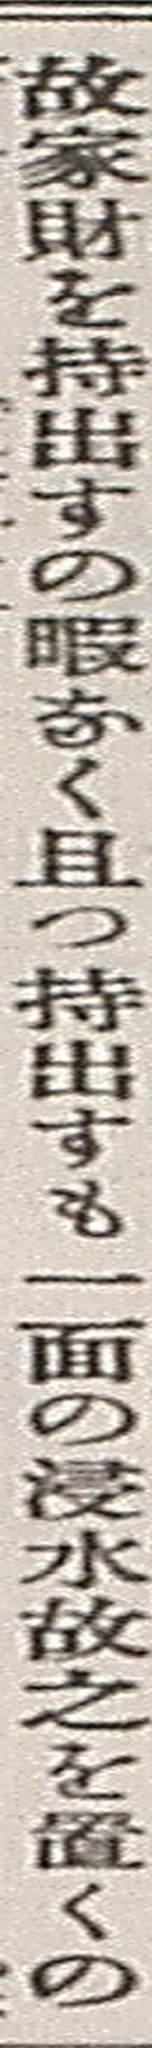故家財を持出すの暇なく且つ持出すも一面の浸水故之を置くの
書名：風俗畫報臨時増刊第百二十八號　洪水被害録（下）
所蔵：東京大学地震研究所図書室 Earthquake Research Institute Library, The University of Tokyo, JAPAN
